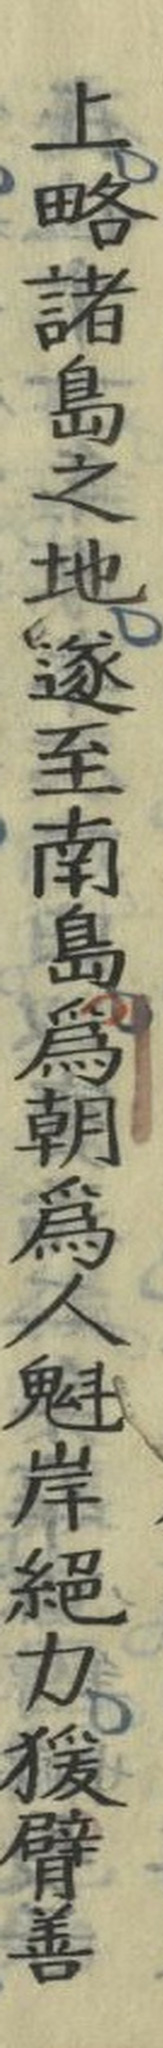上。略諸島之地。遂至南島。爲朝爲人魁岸絕力。猨臂善
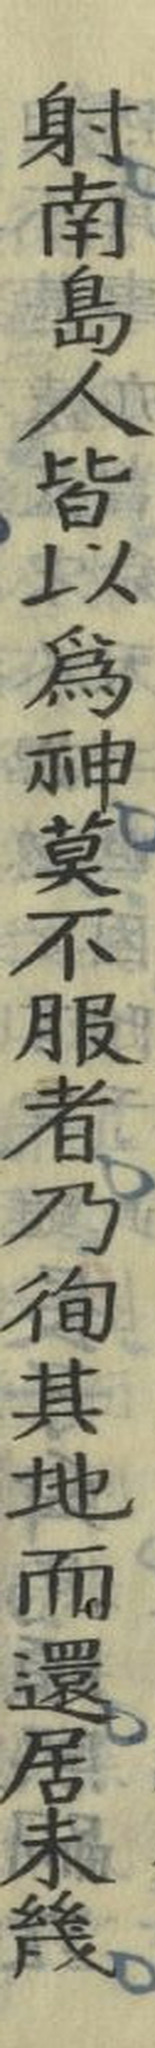射。南島人皆以爲神。莫不服者。乃徇其地而還。居未幾。
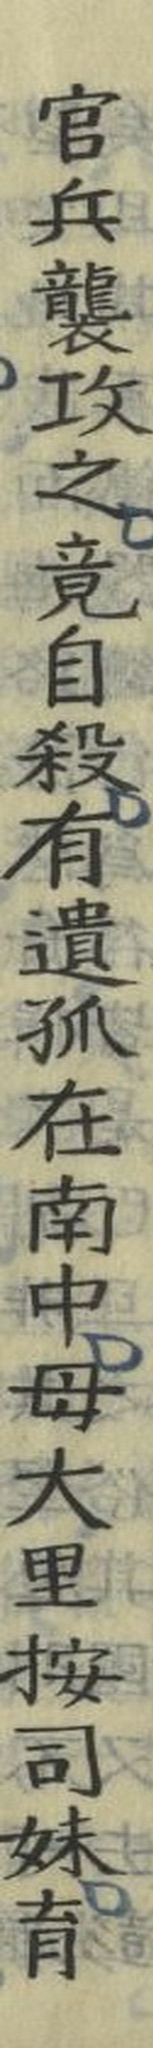官兵襲攻之。竟自殺。有遺孤在南中。母大里按司妹。育
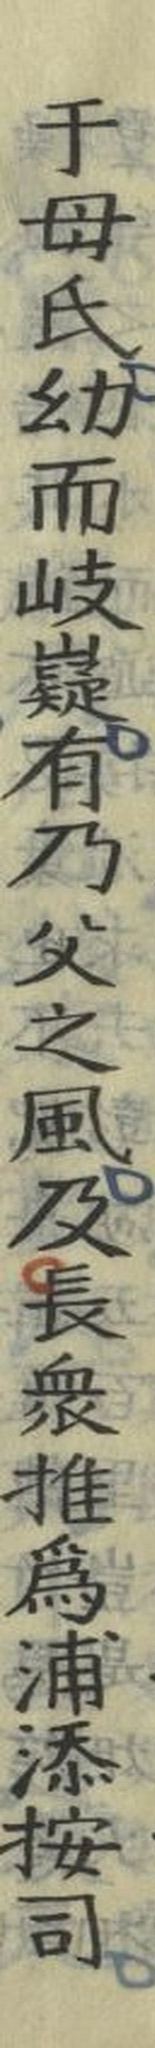于母氏。幼而岐嶷。有乃父之風。及長衆推爲浦添按司。
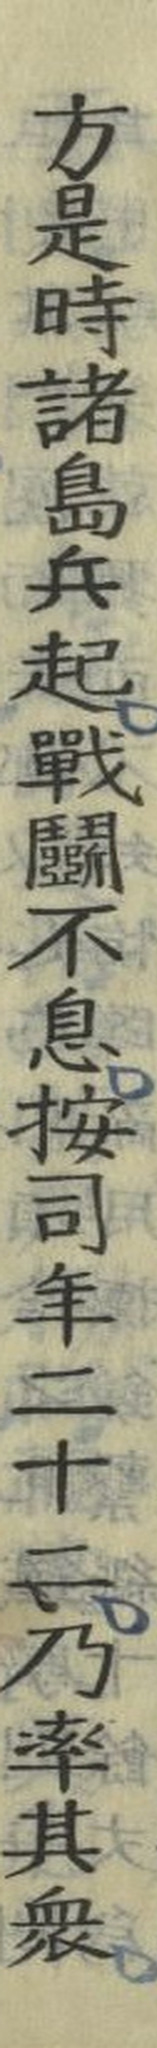方是時諸島兵起。戰鬭不息。按司年二十二。乃率其衆。
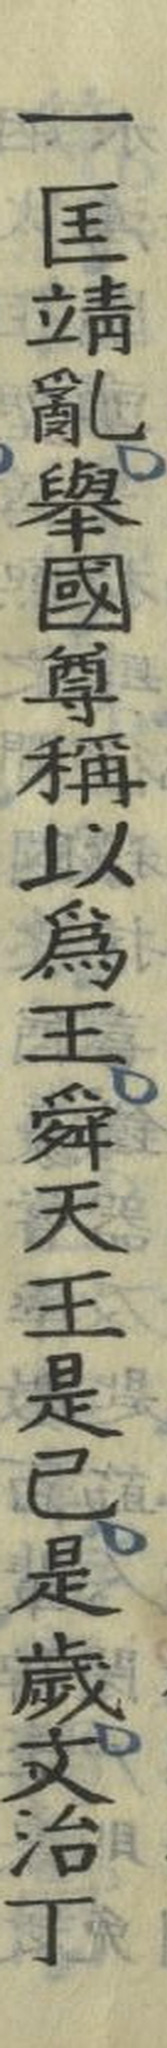一匡靖亂。擧國尊稱以爲王。舜天王是已。是歲文治丁

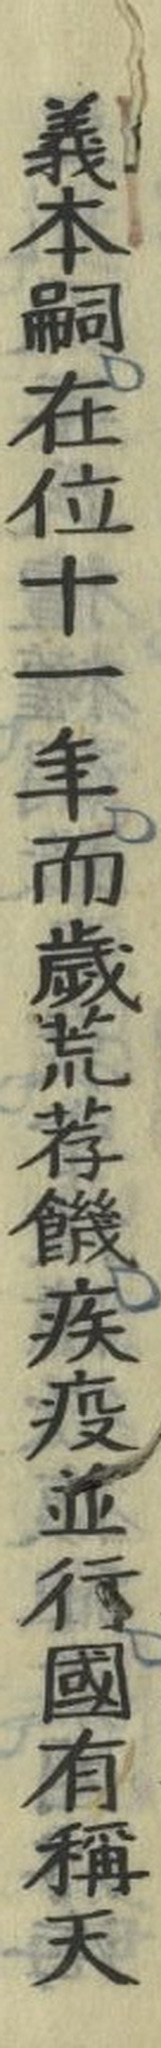義本嗣。在位十一年。而歲荒荐饑。疾疫並行。國有稱天
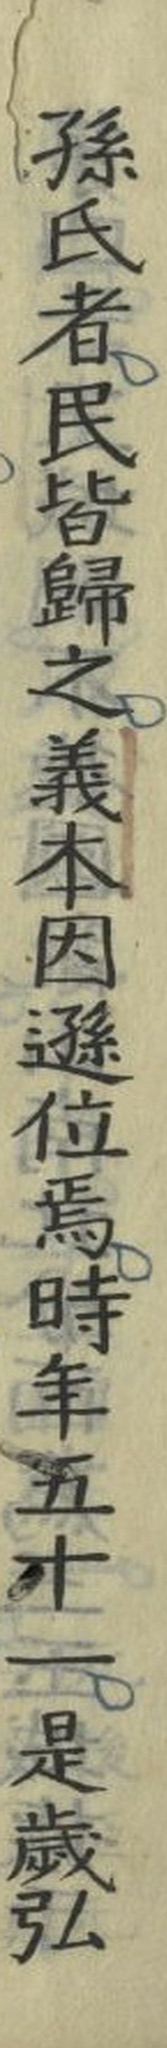孫氏者。民皆歸之。義本因遜位焉。時年五十一。是歲弘
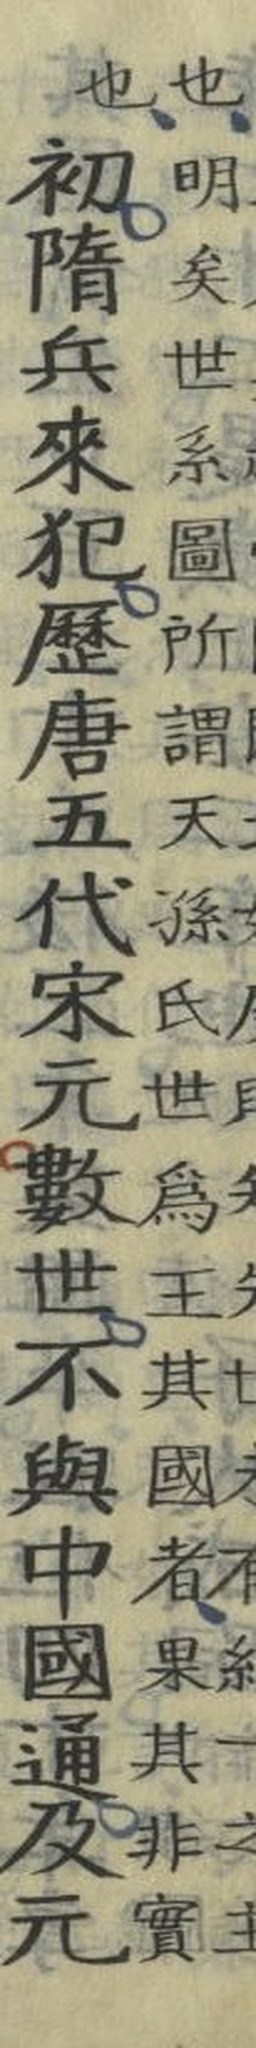也。初。隋兵來犯。歷唐五代宋元數世。不與中國通。及元
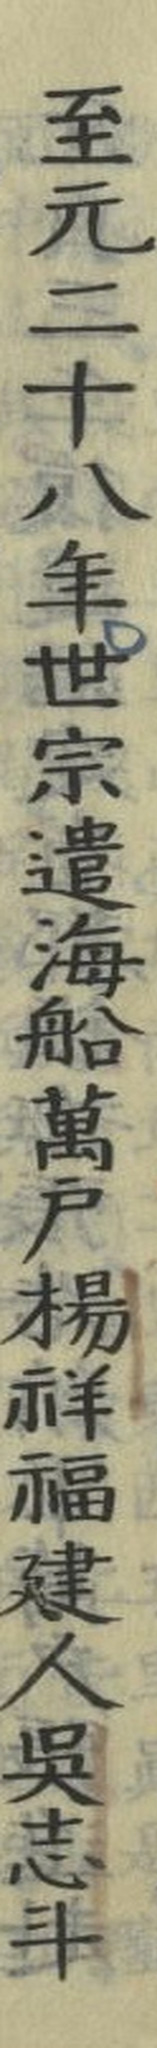至元二十八年。世宗遣海船萬戸楊祥福建人吳志斗
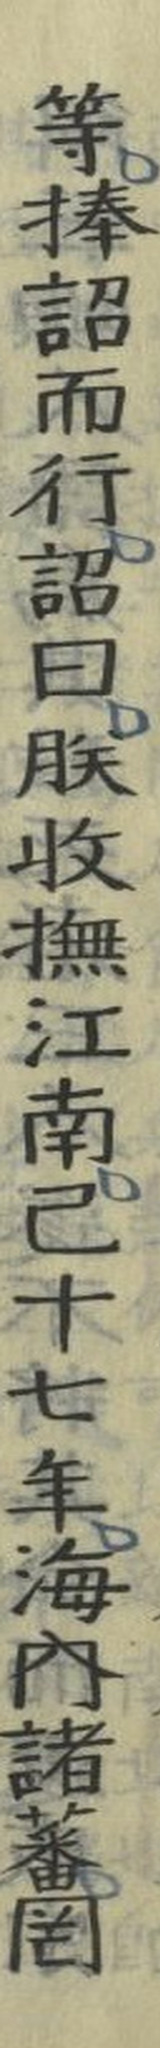等。捧詔而行。詔曰。朕收撫江南。己十七年。海内諸諸蕃。罔
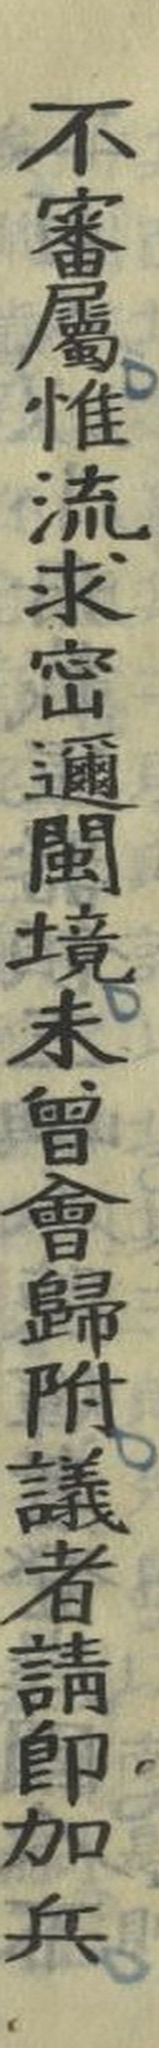不審屬。惟流求密邇閩境。未曾會歸附。議者請卽加兵。
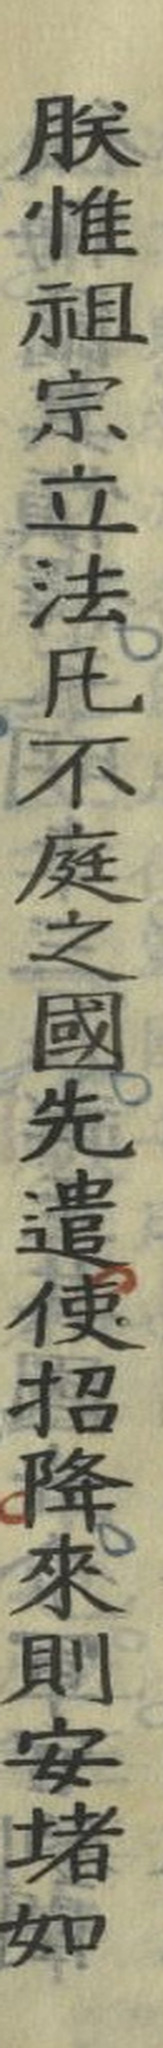朕惟祖宗立法。凡不庭之國。先遣使招降。來則安堵如
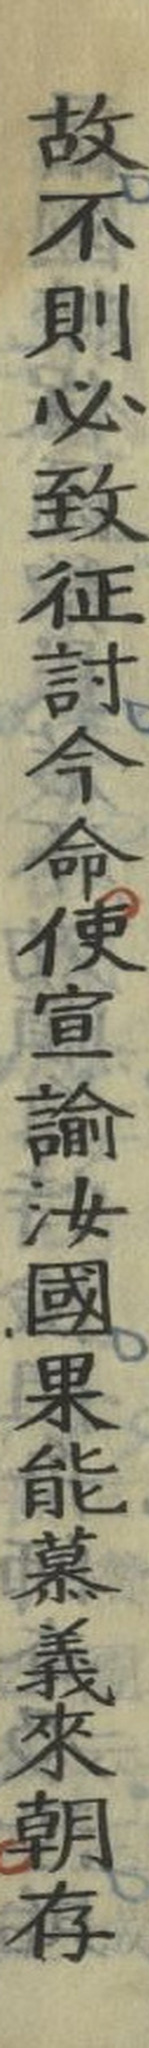故。不則必致征討。今命使宣諭汝國。果能慕義來朝存

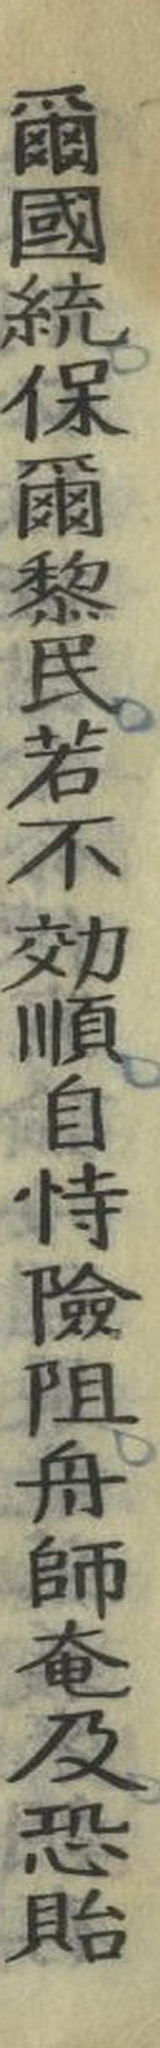爾國統。保爾黎民。若不効順。自恃險阻。舟師奄及。恐貽
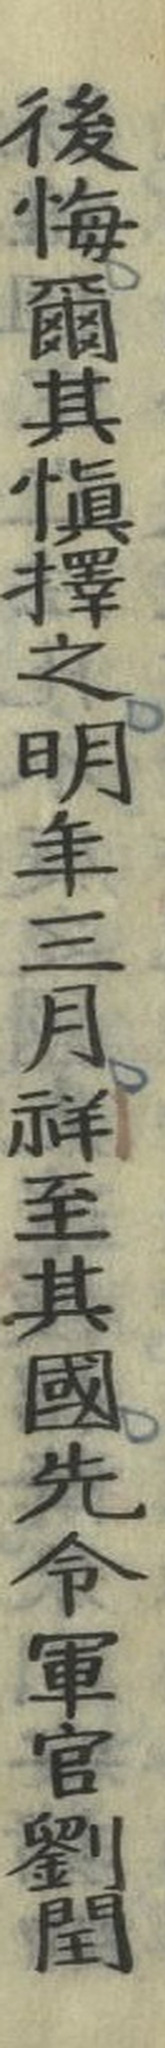後悔。爾其愼擇之。明年三月。祥至其國。先令軍官劉閏
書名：南島志
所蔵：University of the Ryukyus Library
